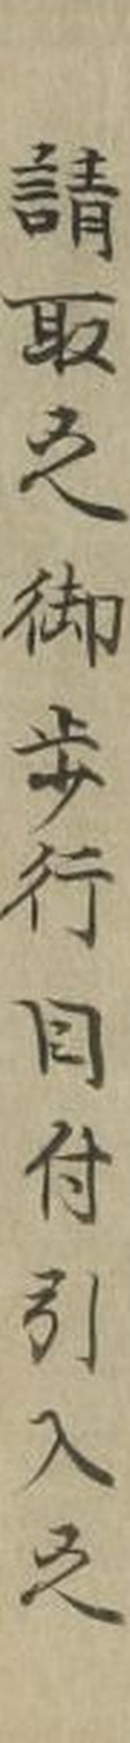請取之御歩行目付引入之
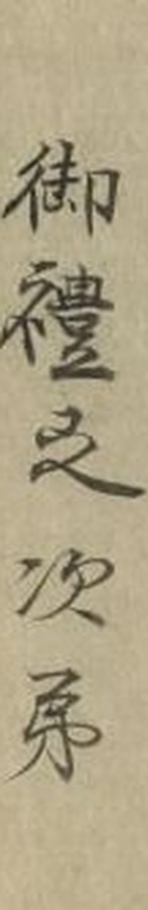御礼之次第
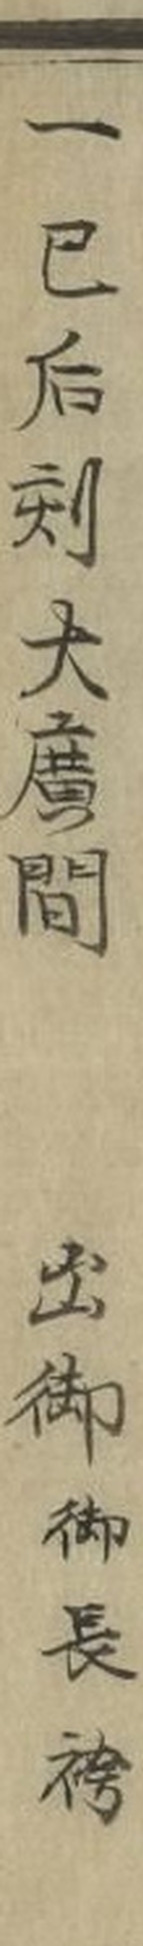一巳后刻大広間出御御長袴
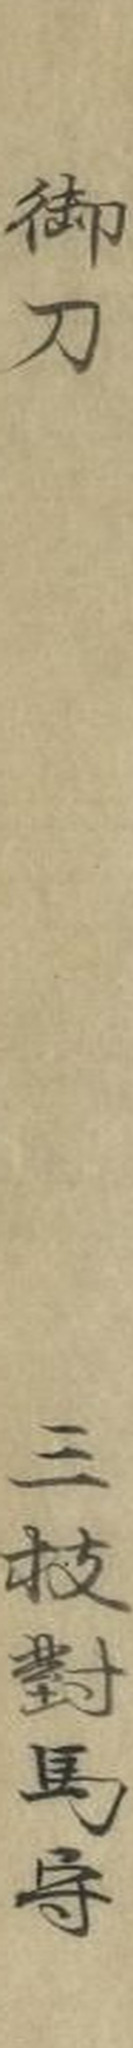御刀三枝對馬守
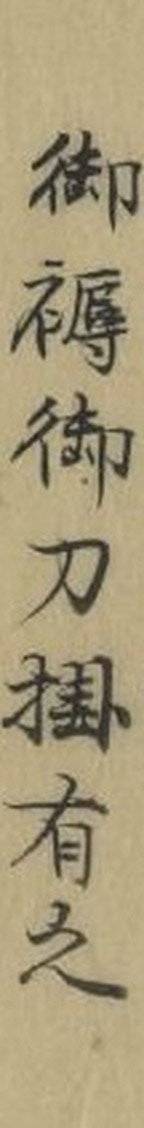御褥御刀掛有之
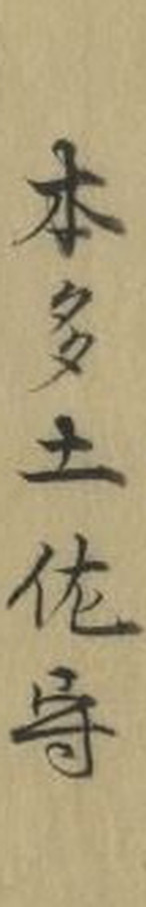本多土佐守
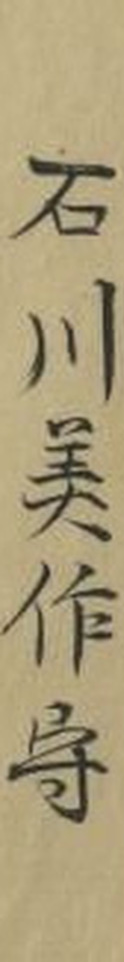松平美作守
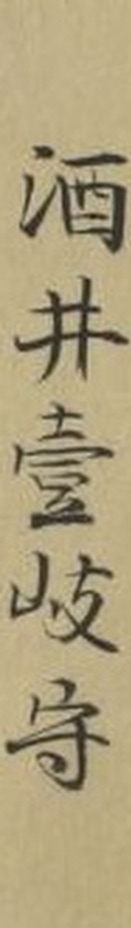酒井壱岐守
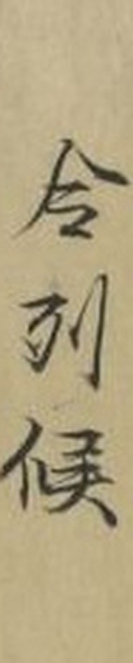令列候
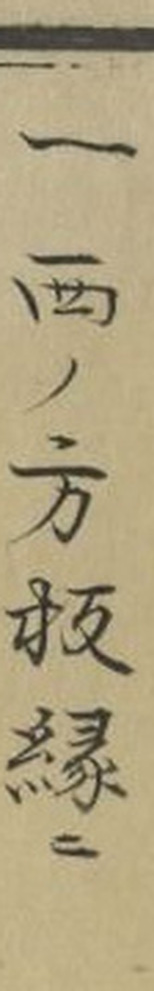一西ノ方板縁ニ
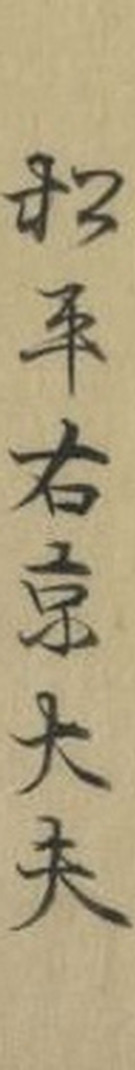松平右京大夫
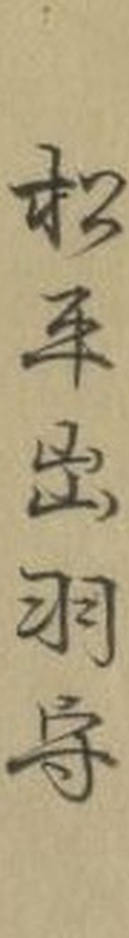松平出羽守
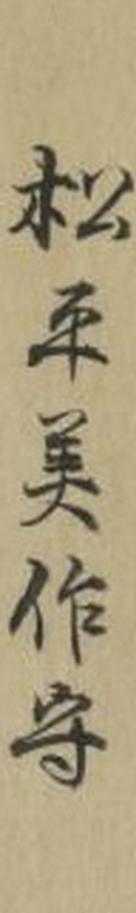松平美作守
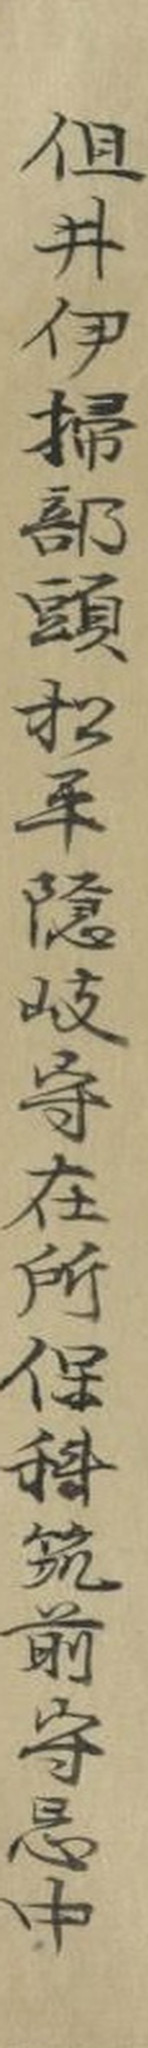但井伊掃部頭松平隠岐守在所保科筑前守忌中
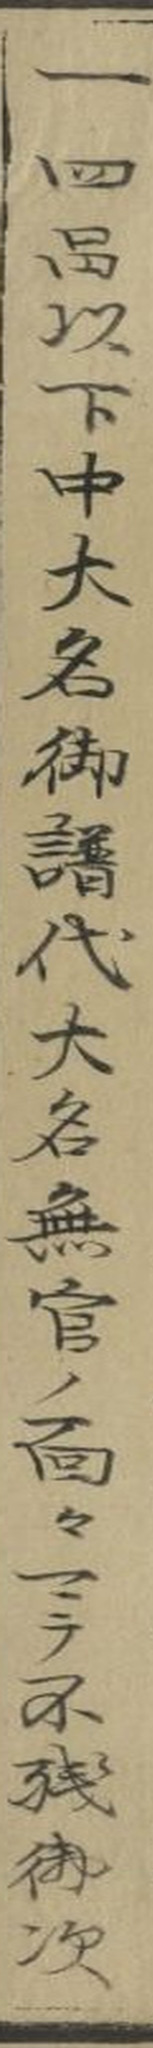一四品以下中大名御譜代大名無官ノ面々マテ不残御次

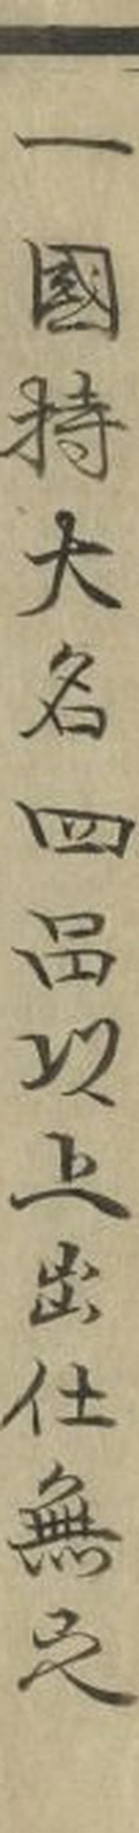一国持大名四品以上出仕無之
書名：琉球往来（下）
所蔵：University of the Ryukyus Library
